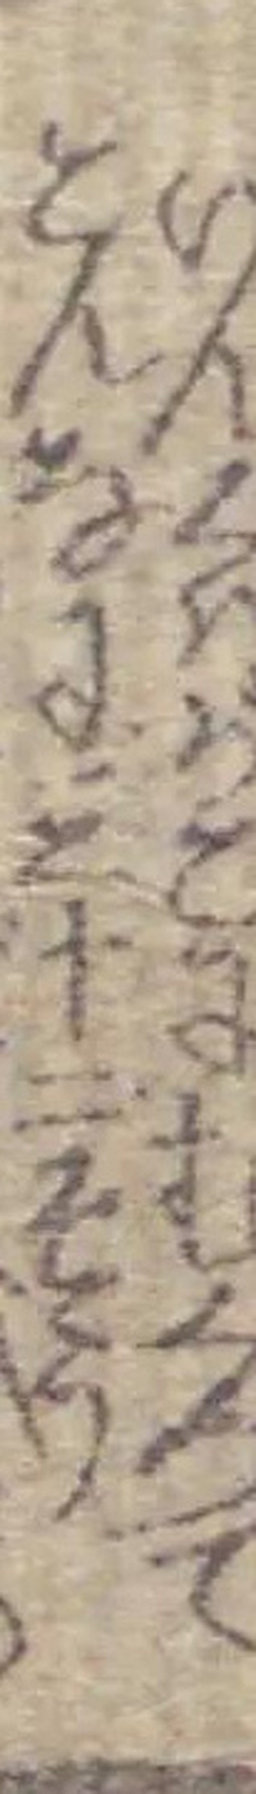こんなに三十二そう
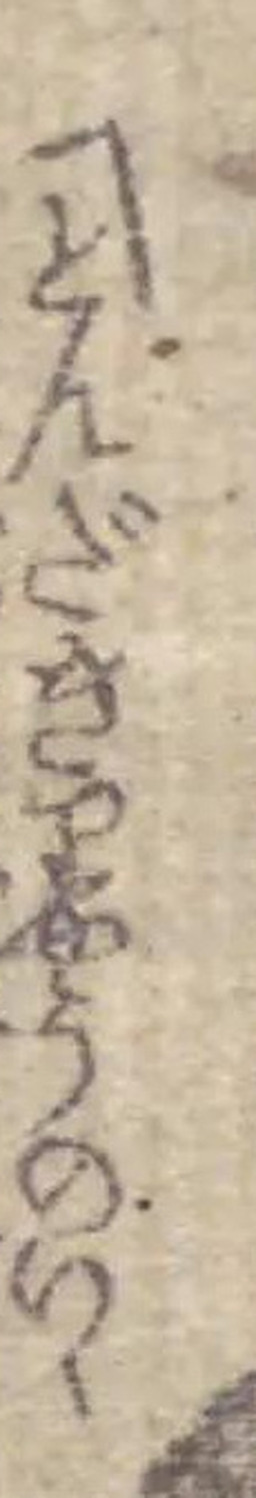〽とんだきりやうのいゝ
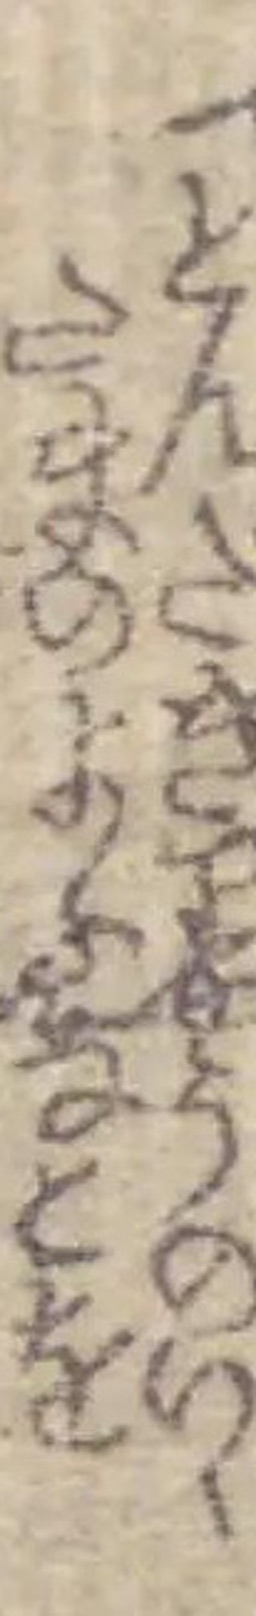たまのよふなこを
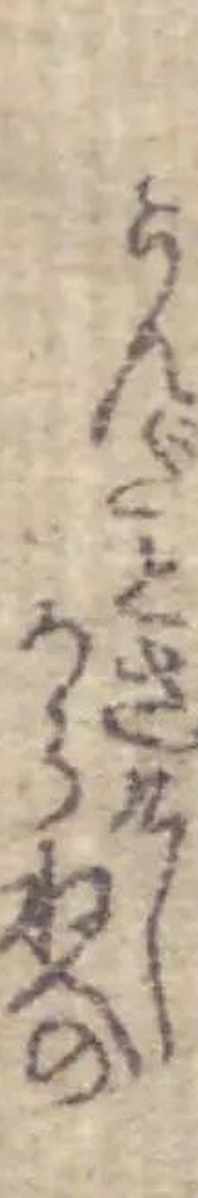うんだとさけし
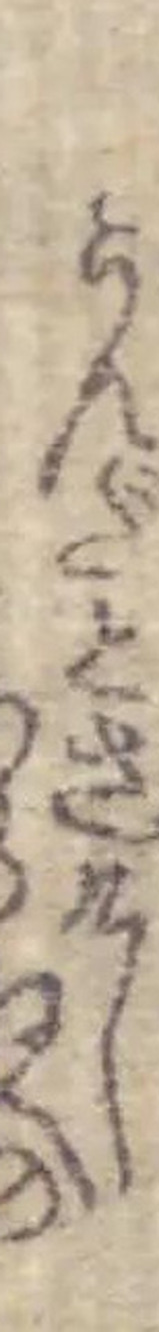うんだとさけし
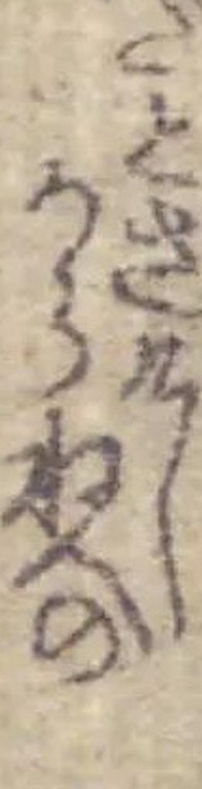からねへの
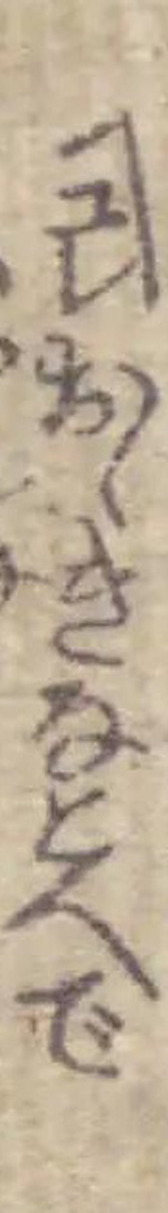〽コレおゝきなこへで
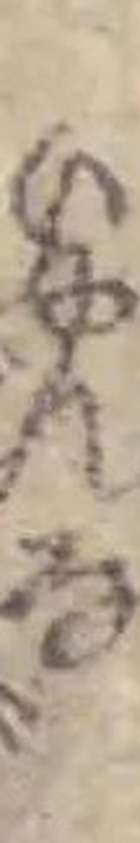いやんな
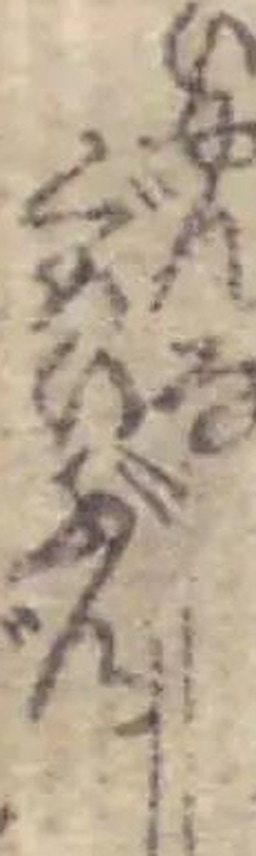ぐはいぶん

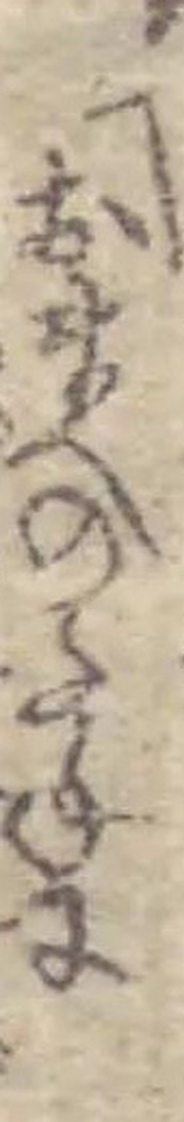〽おまへのたねに
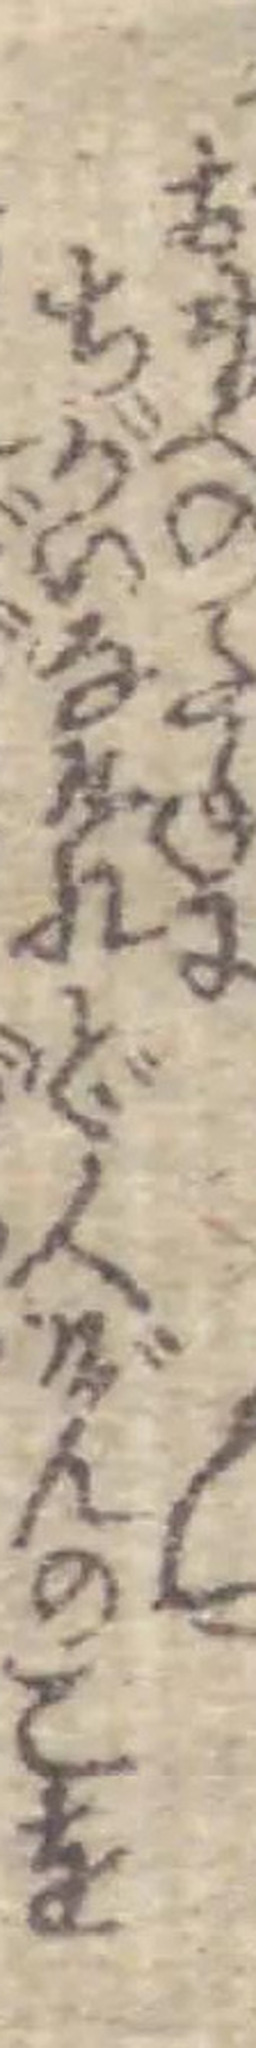ちがいなけれども人げんのこを
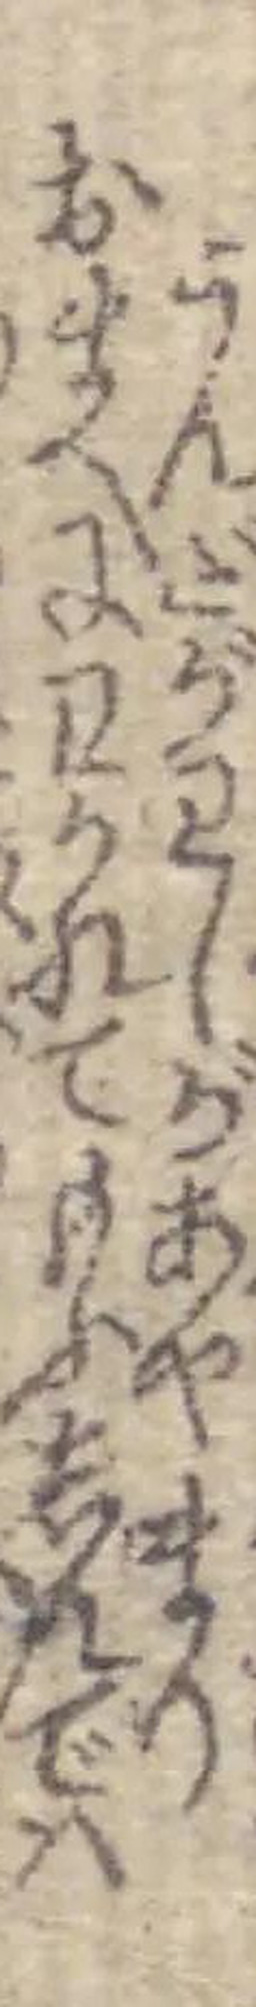おまへにわかれてもうふしんでは
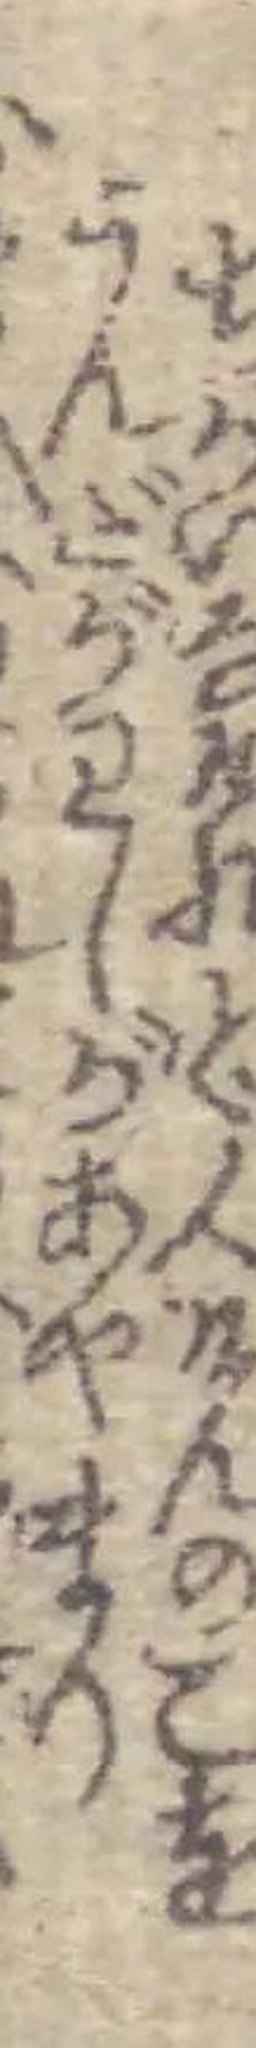うんだがわしがあやまり
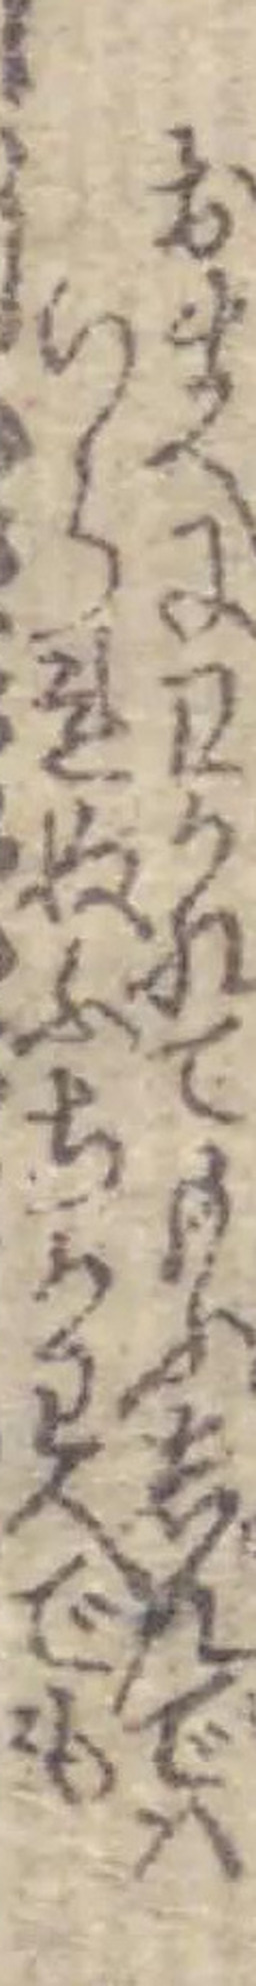いられぬぶちかわへでも
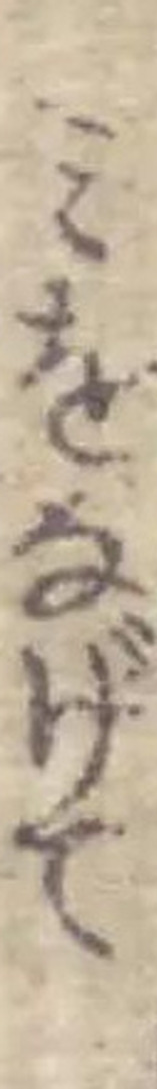みをなげて
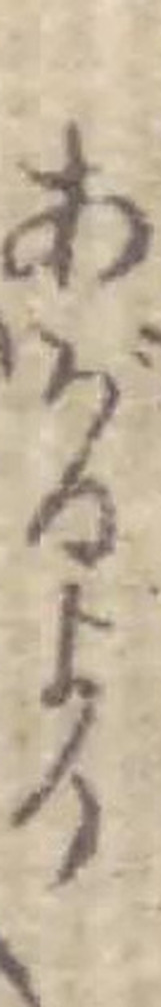あがるより
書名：化物尽 4巻
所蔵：国立国会図書館 National Diet Library, JAPAN
